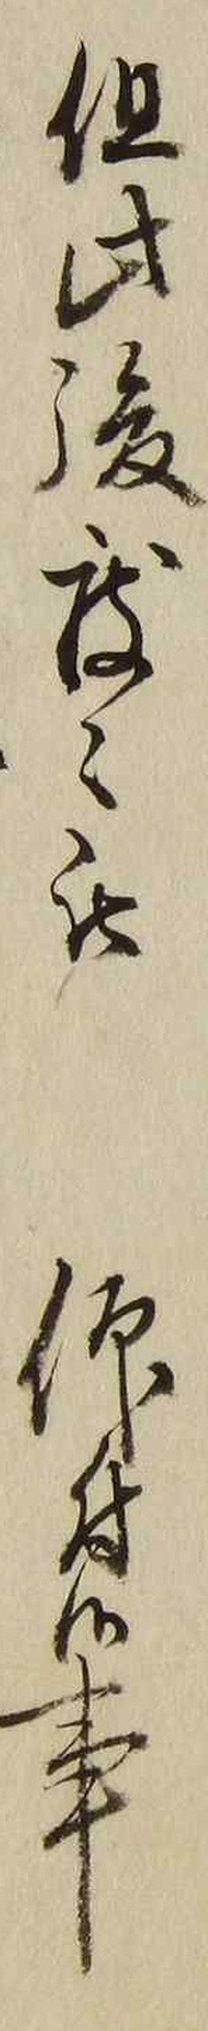但此後度々被仰付候事
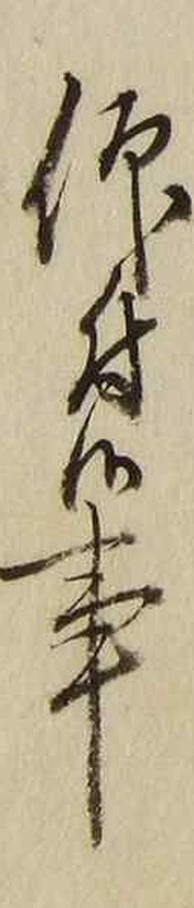仰付候事
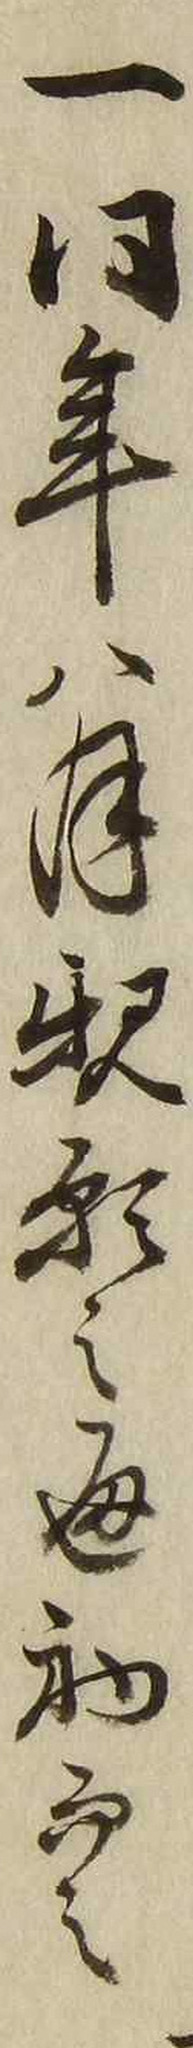一同年八月親願之通初而之

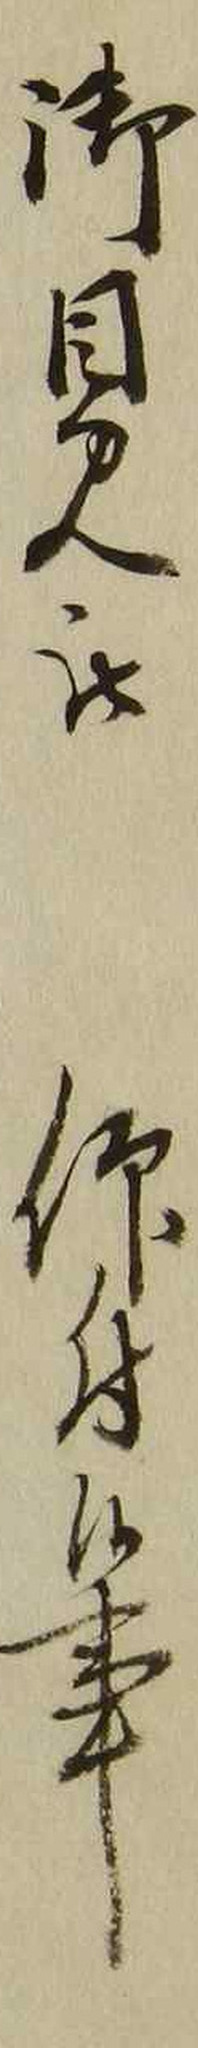御目見被仰付候事
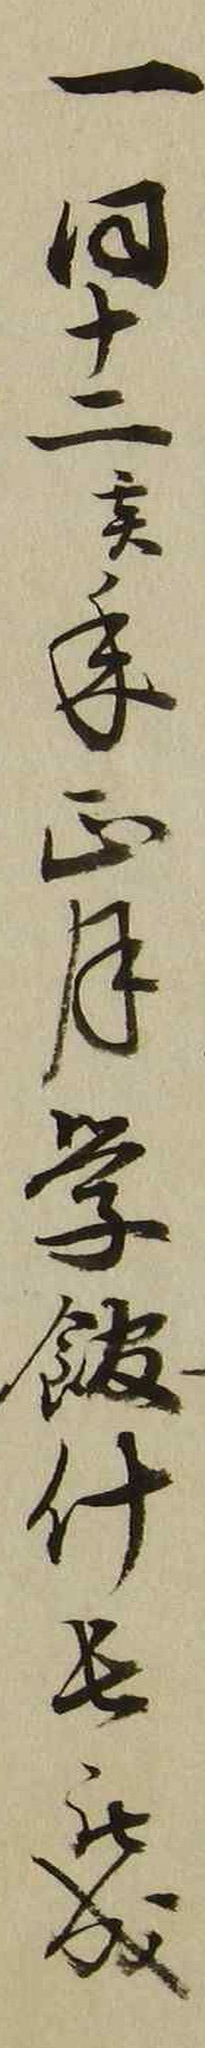一同十二亥年正月学館什長被成
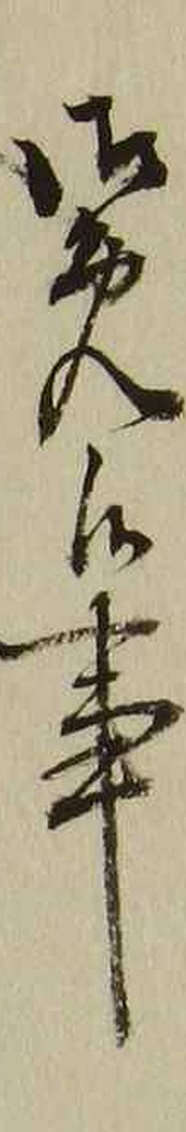御免候事
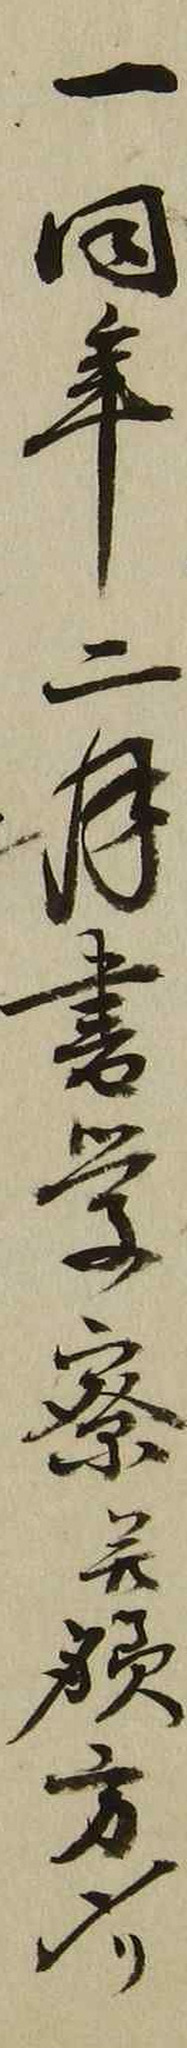一同年二月書学寮并躾方〆り
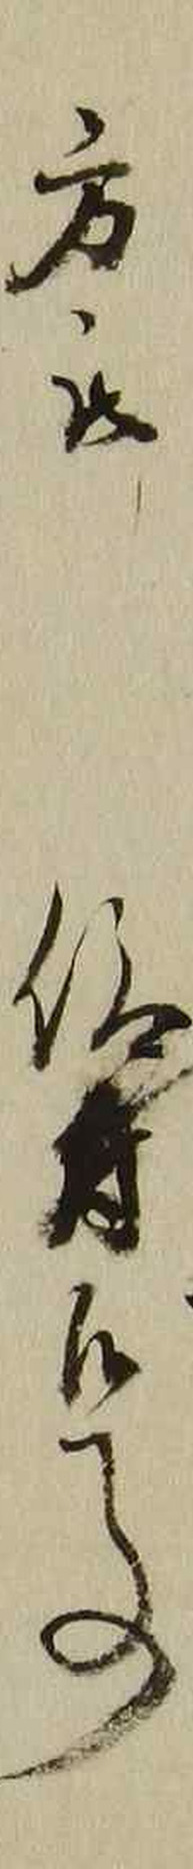方被仰付候事
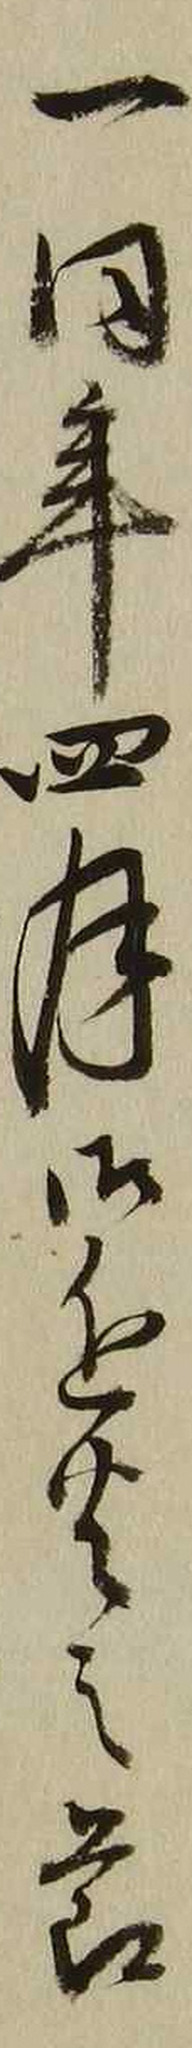一同年四月御近火之節
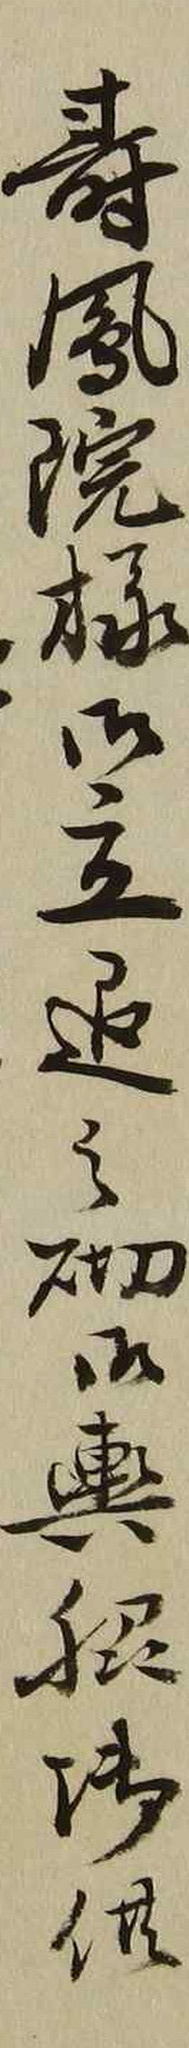寿鳳院様御立退之砌御輿脇御供
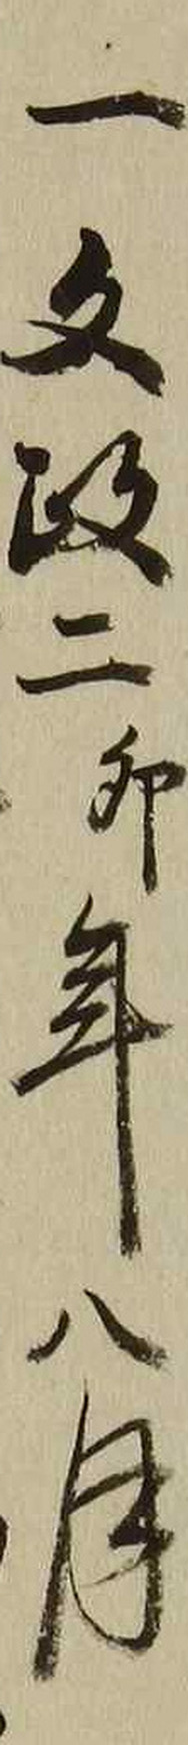一文政二卯年八月
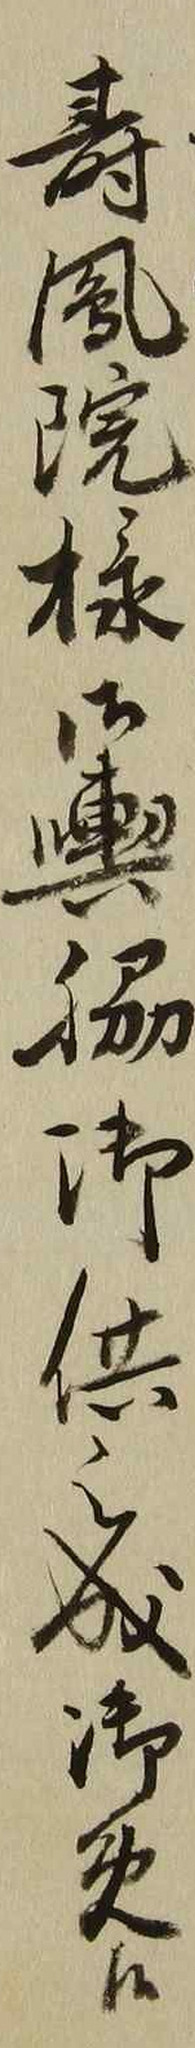寿鳳院様御輿脇御供被成御免候
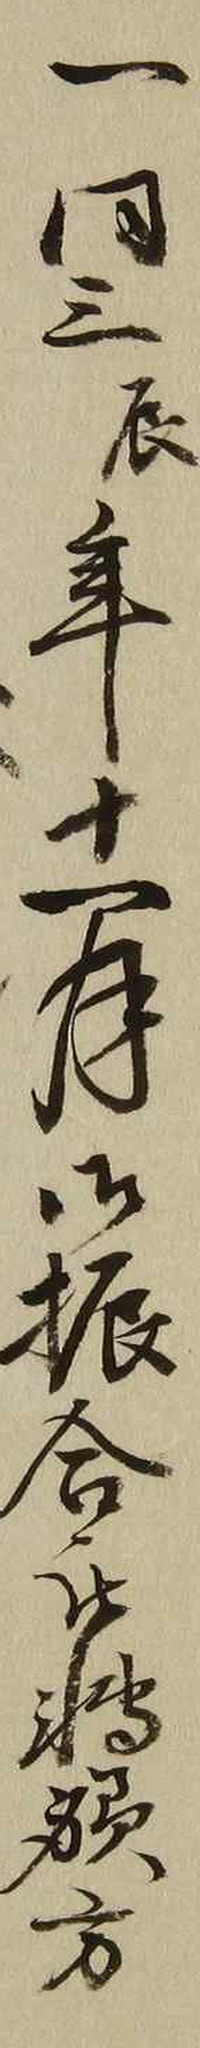一同三辰年十一月御振合被転躾方
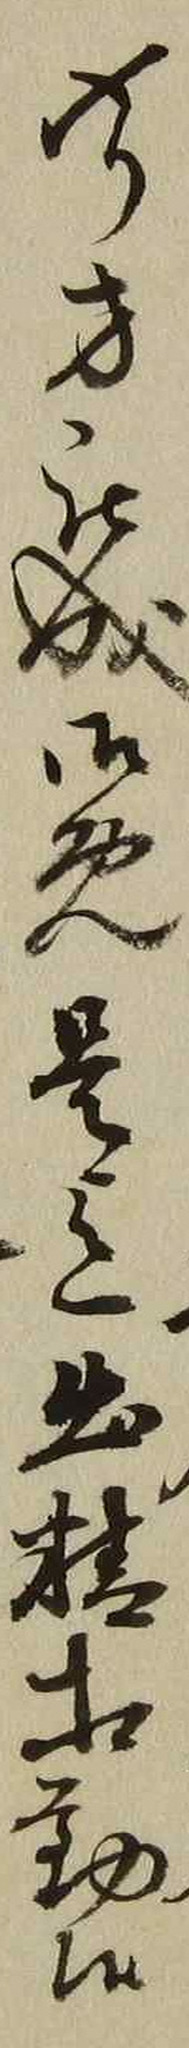〆り方被成御免是迄出精相勤候
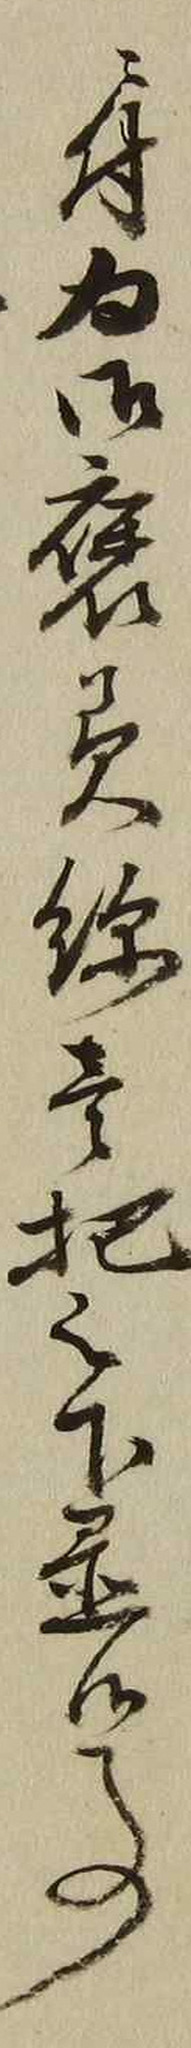ニ付為御褒美綿壱把被下置候事
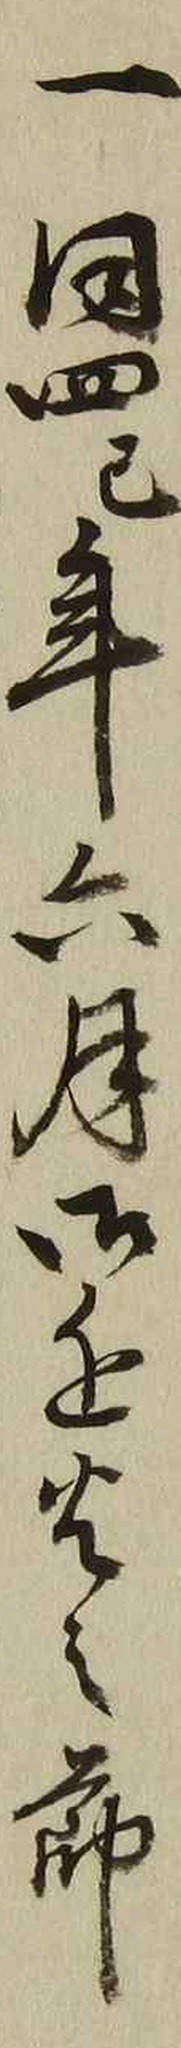一同四巳年六月御近火之節
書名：諸士系譜　巻之35　は之部3
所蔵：会津若松市立会津図書館
